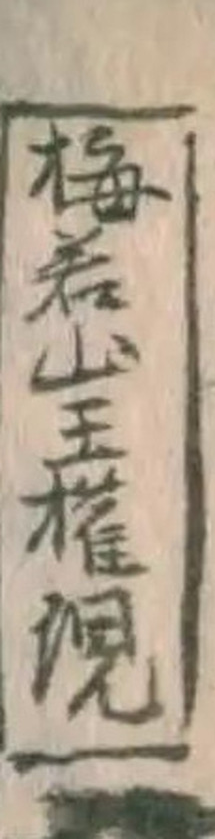梅若山王権現

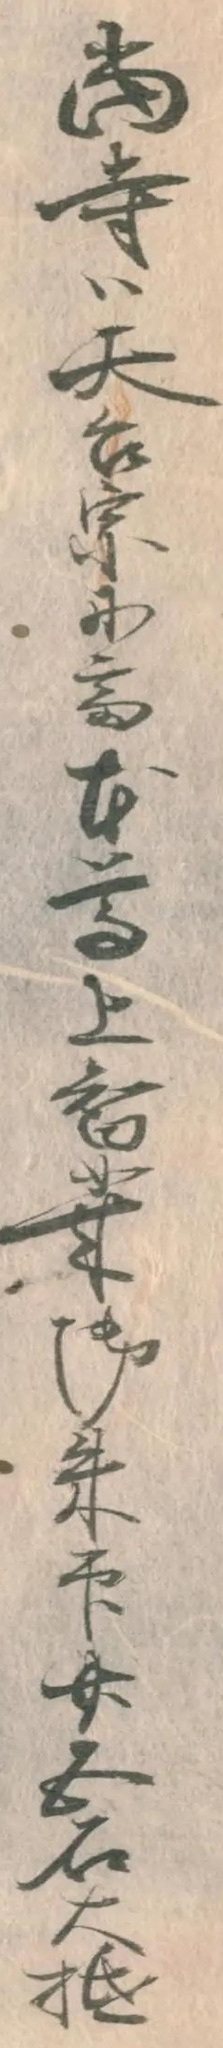当寺は天台宗にて本尊上智如来御朱印廿五石大抵
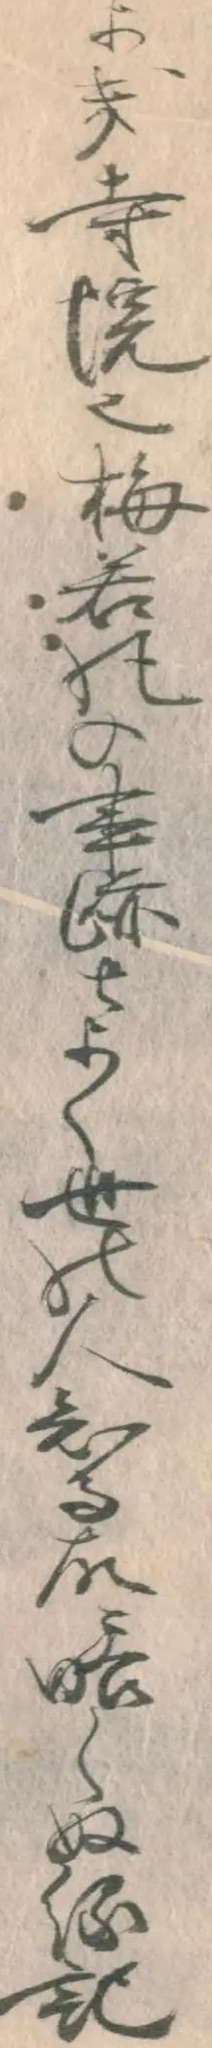よき寺院也梅若丸の事跡はよく世の人知る故に略しぬ縁起
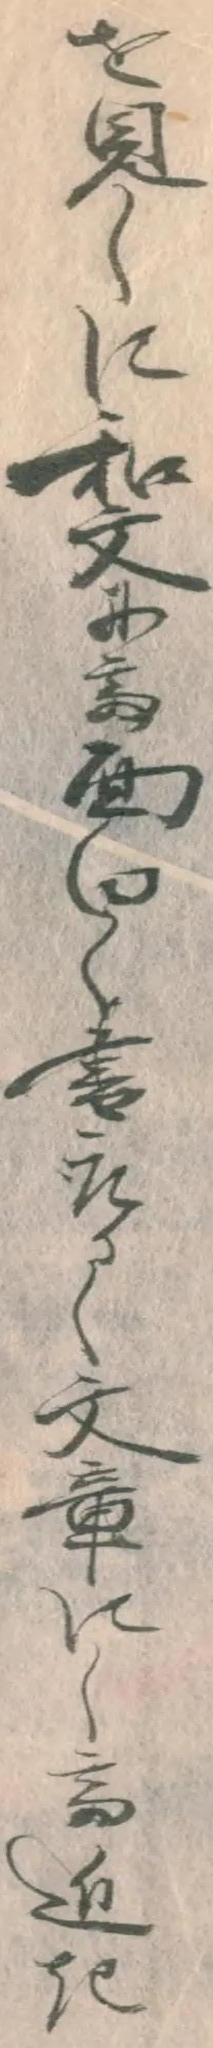を見しに和文にて面白く書取りし文章にして近き
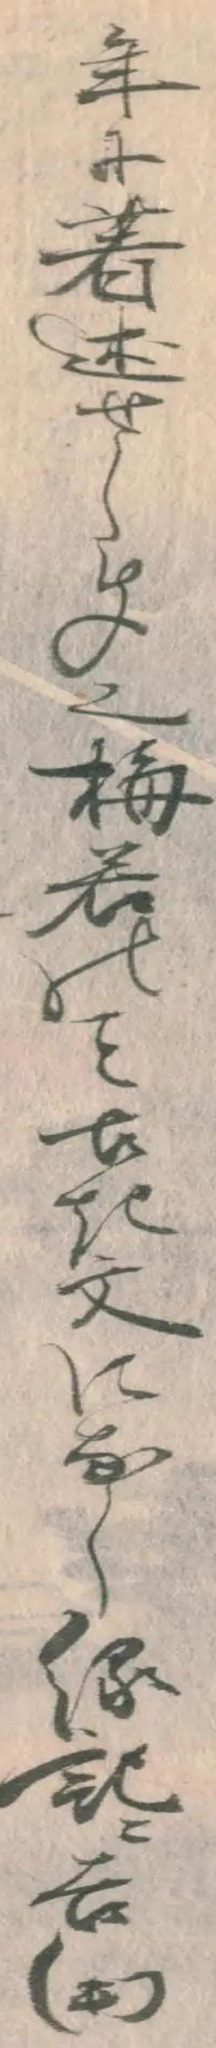年に著述せしもの也梅荷のこと古き文になく縁記に吉田
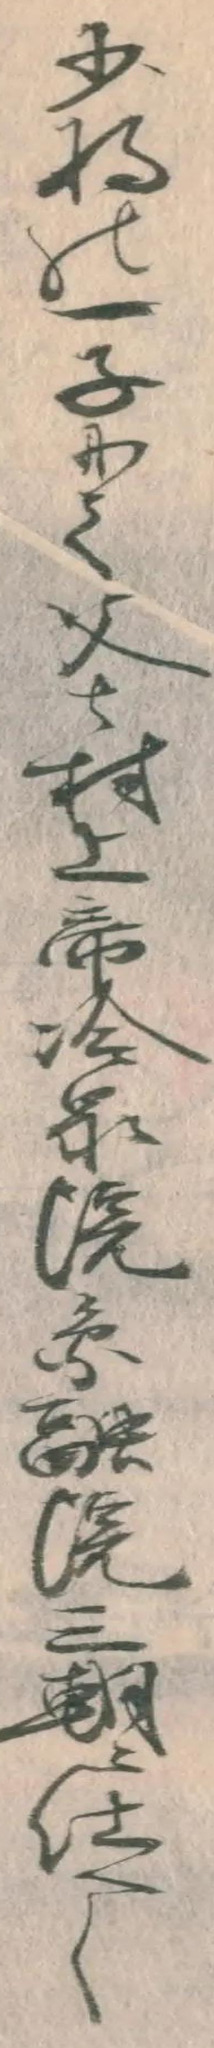少将の一子にて父は村上帝冷泉院円融院三朝に仕へし
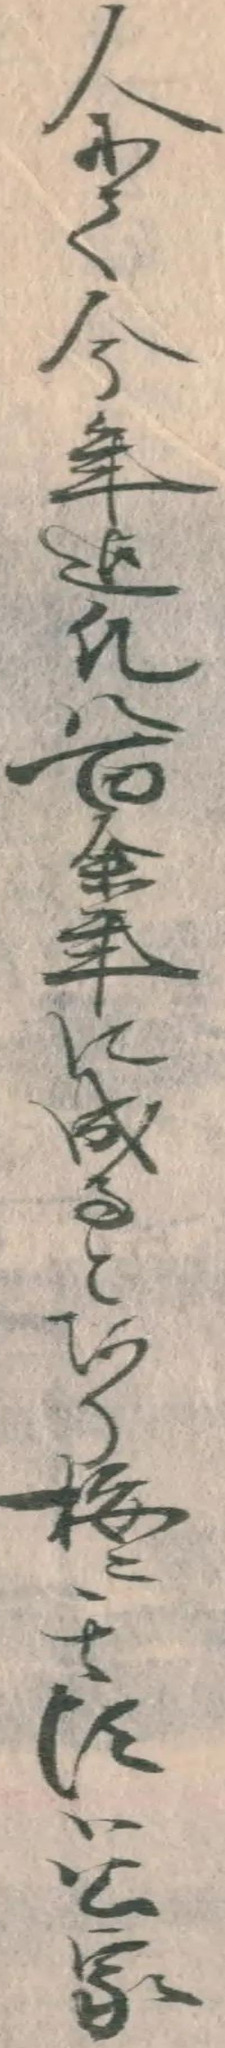人にて今年迄凡八百余年に成るとあり按に其頃は公家
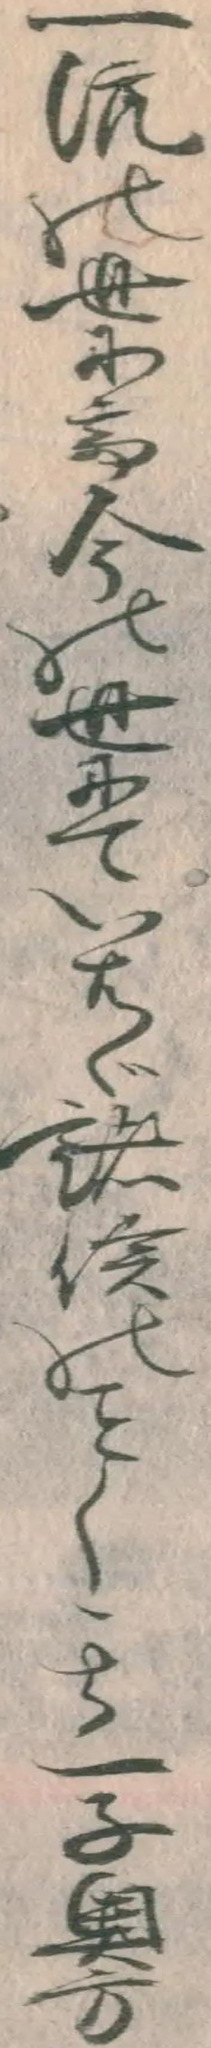一流の世にて今の世にていはゞ諸侯のことく其一子奥方
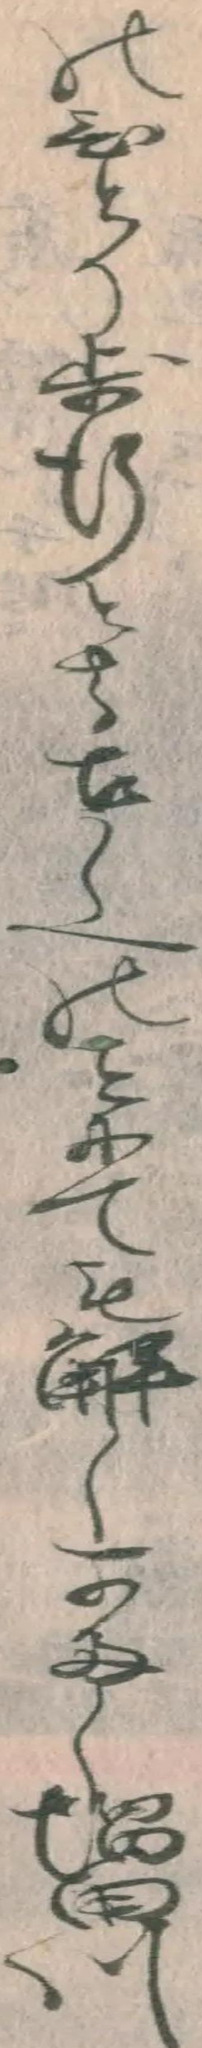のひとり歩行とは古しくへのことにても解しかたく隅田川
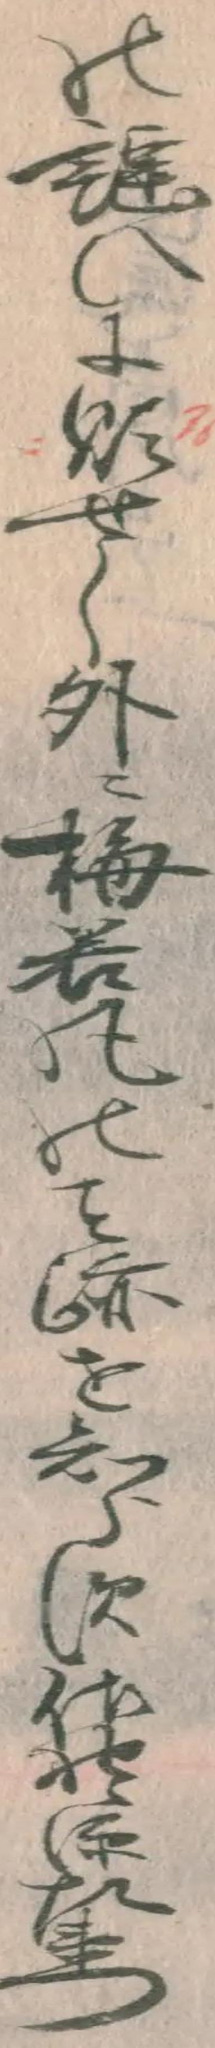の謡ひに顕せし外に梅若丸のこと跡を知らす佐野源左衛門
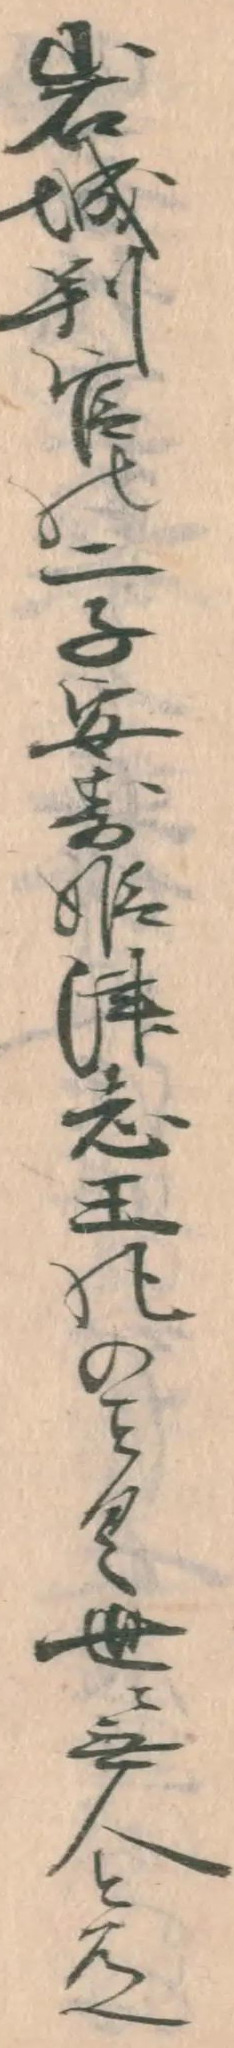岩城判官の二子安寿姫津志王丸のことく世に無人と見へ
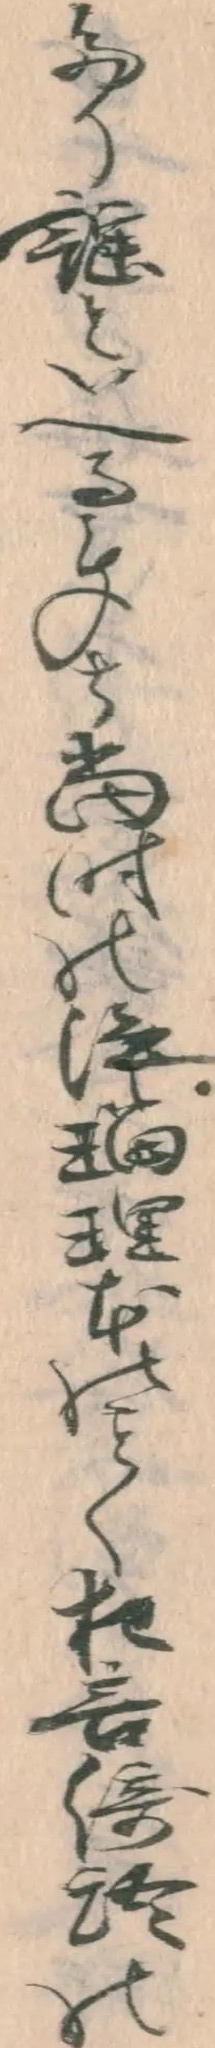たり謡といへるものは当時の浄瑠璃本のことく狂言綺語の
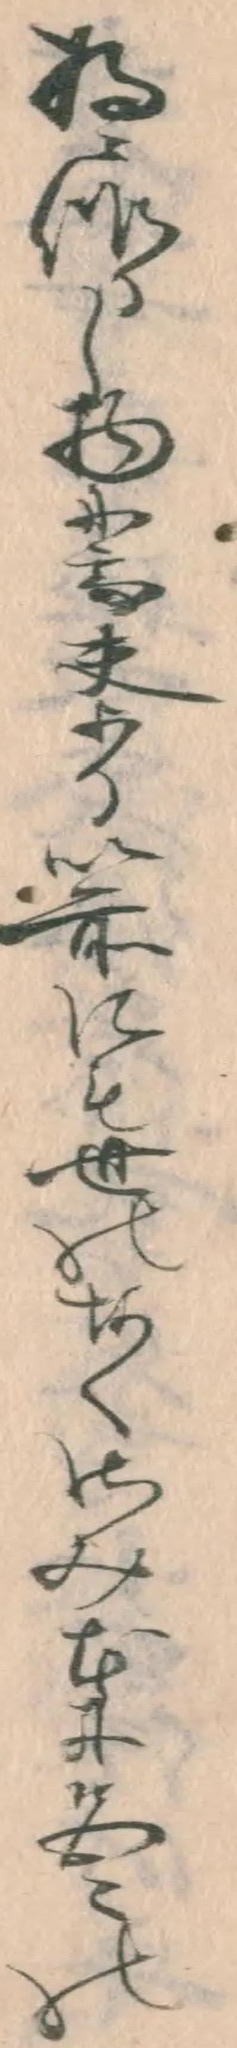為に作りし物にて夫より以前にも世のなくさみ本に色々の
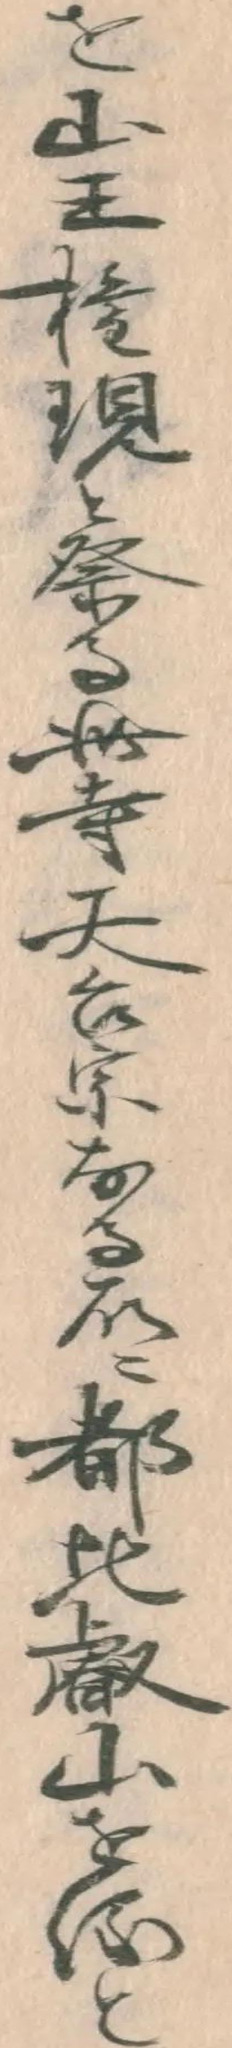を山王権現と祭る此寺天台宗なる故に都北叡山を縁と
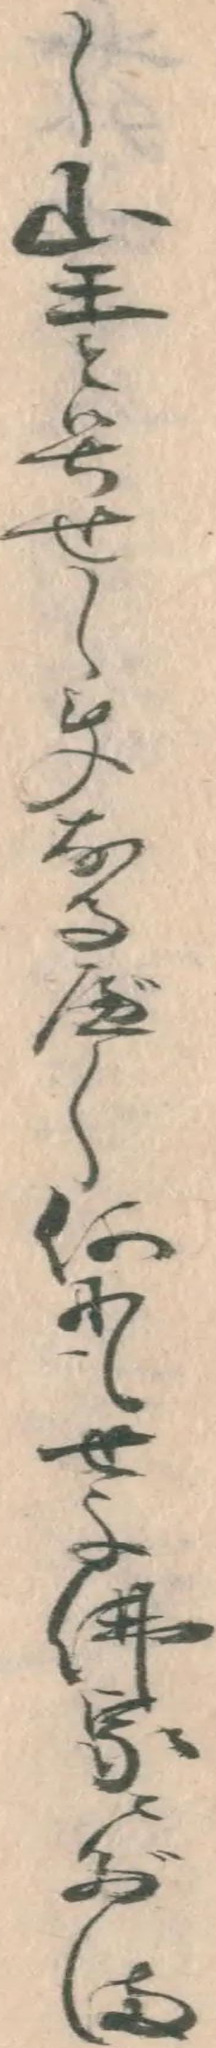し山王と号せしものなるべし何にもせよ仏家にだま
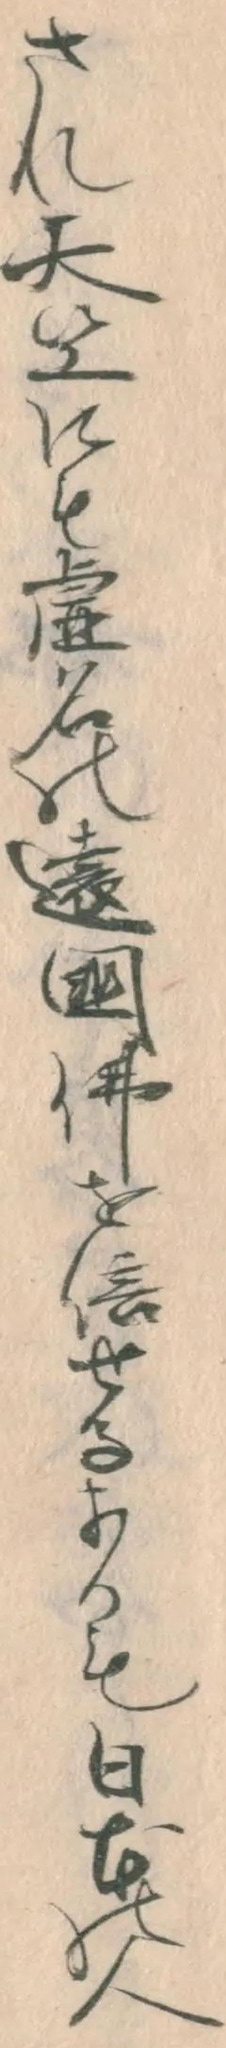され天竺にも虚名の遠国仏を信せるよりも日本の人
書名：四神地名録 6巻. [4]葛飾郡
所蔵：国立国会図書館 National Diet Library, JAPAN
